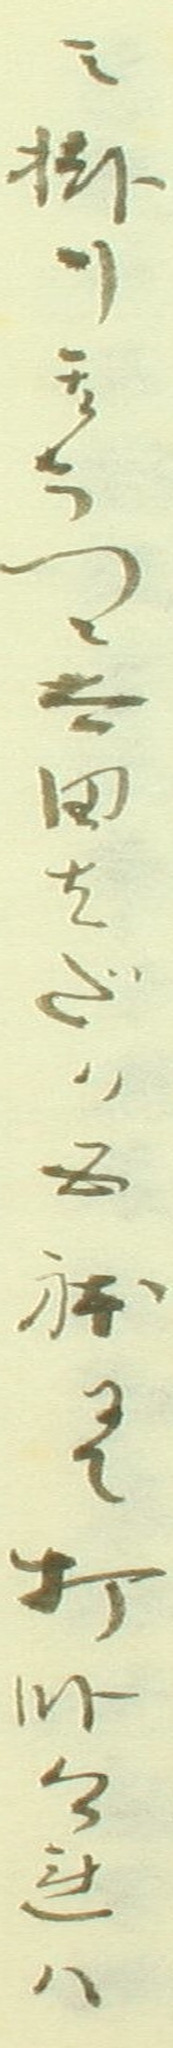み掛り？うつと太田はだは五躰にて打臥けれは
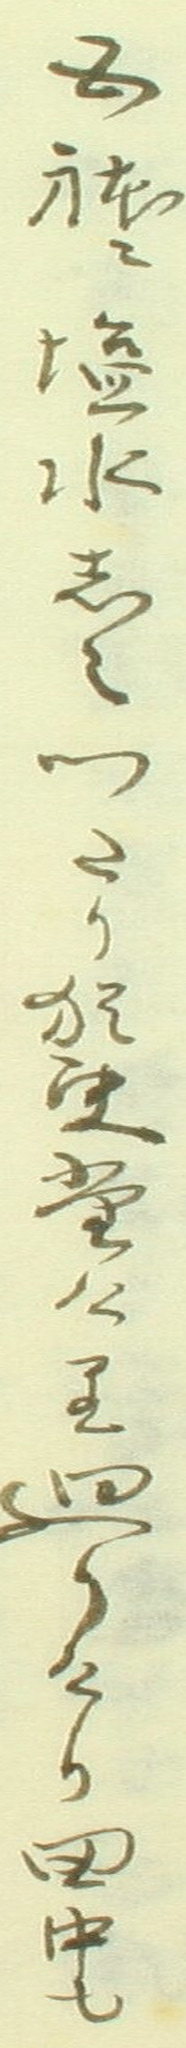五躰に塩水しみわたり猶更たけり廻りけり田中も
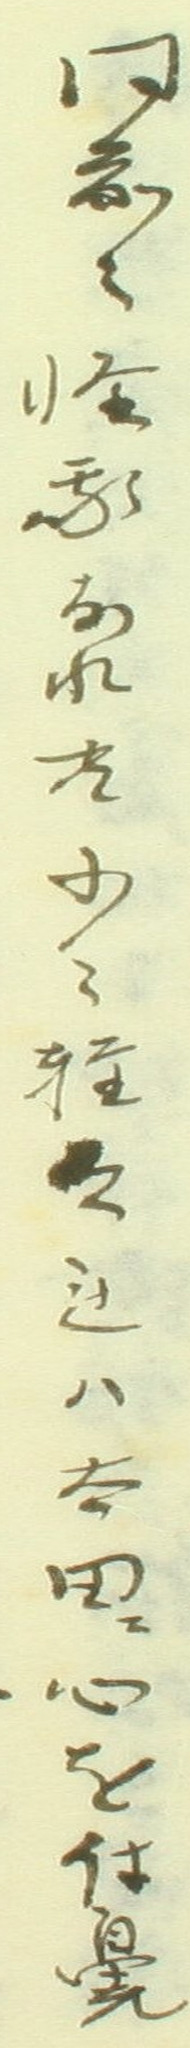同前之怪我なれ共少々軽けれは大田に心を付鼻
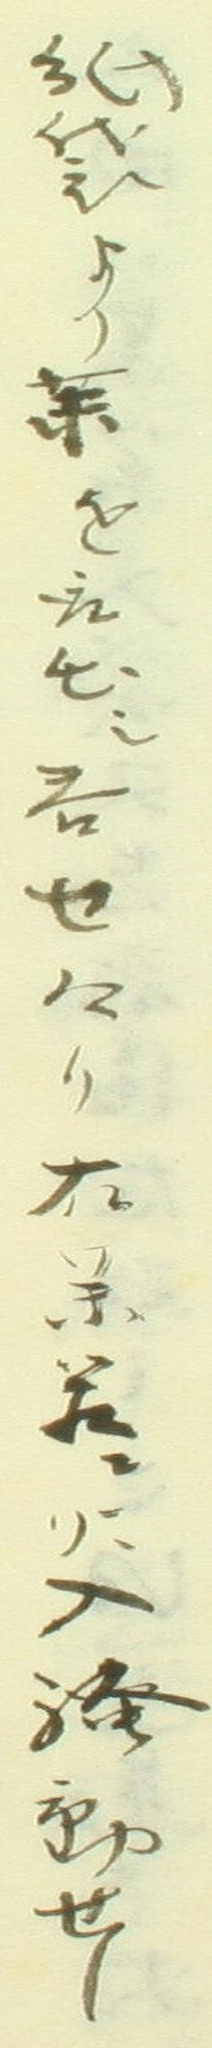紙袋より薬を取出し呑せけり右薬若し火入験動せし
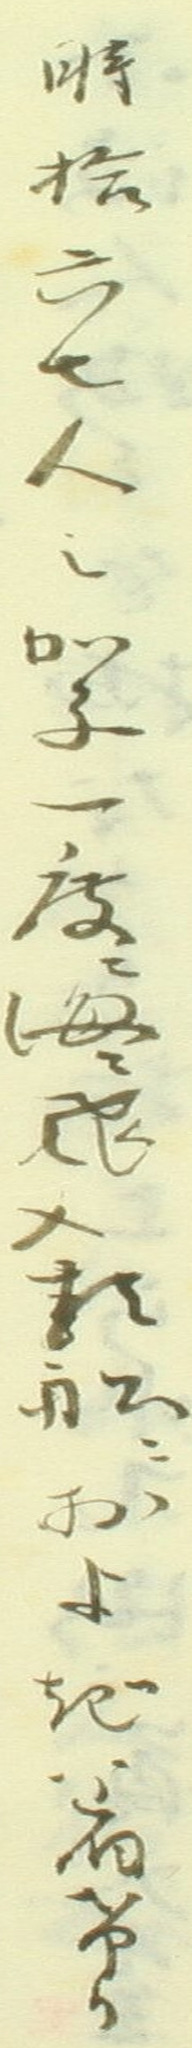時拾六七人之加子一度に海に逃入類船におよぎ着けり
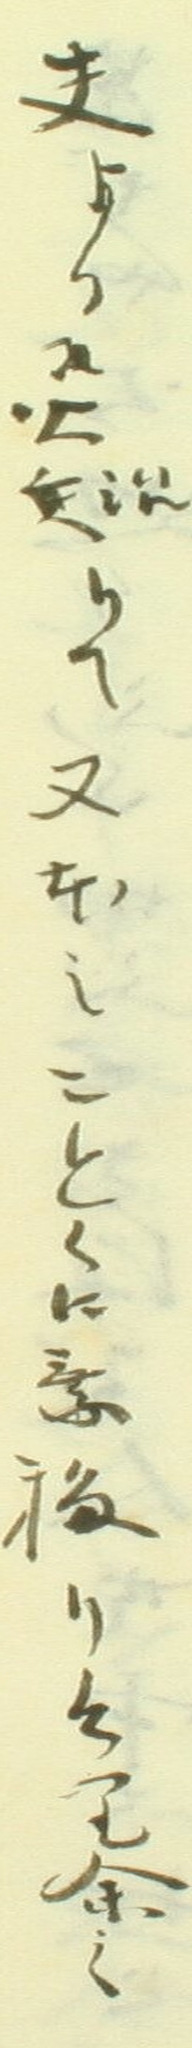夫より？火？りて又本のことくに乗移りけり余之
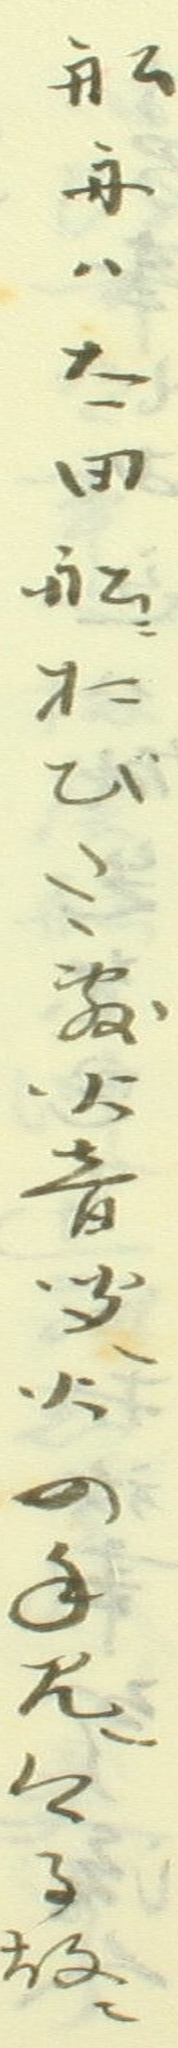船舟は太田船におびたた敷火音聞へ火の手見へける故に
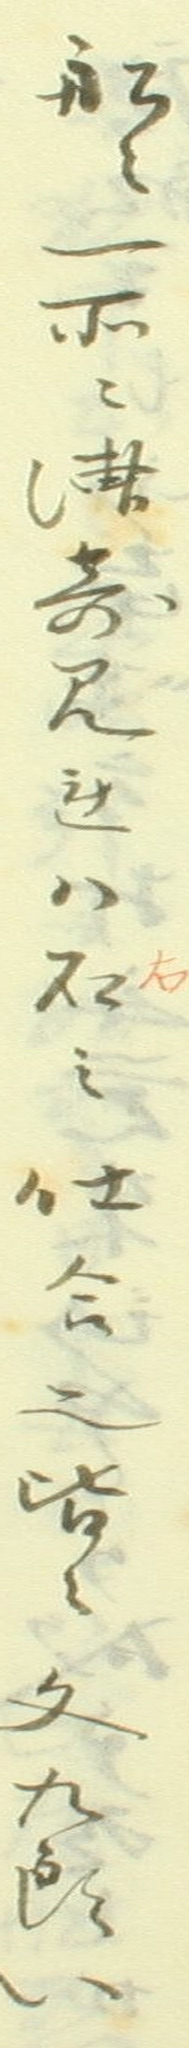船船一所に漕寄見れは石之仕合也皆々文九朗い
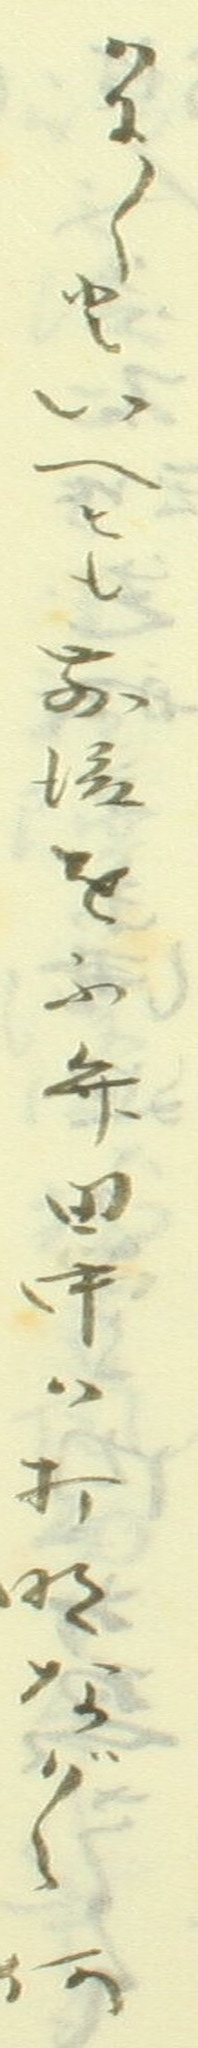かにいかにといへとも前後不弁田中は打明ながら何
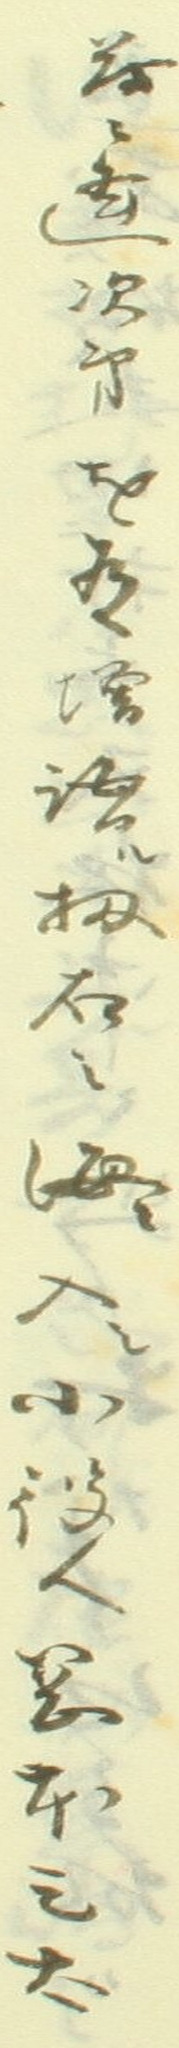？に逢次第を有増語る扨右之海に入し小役人岡本元太
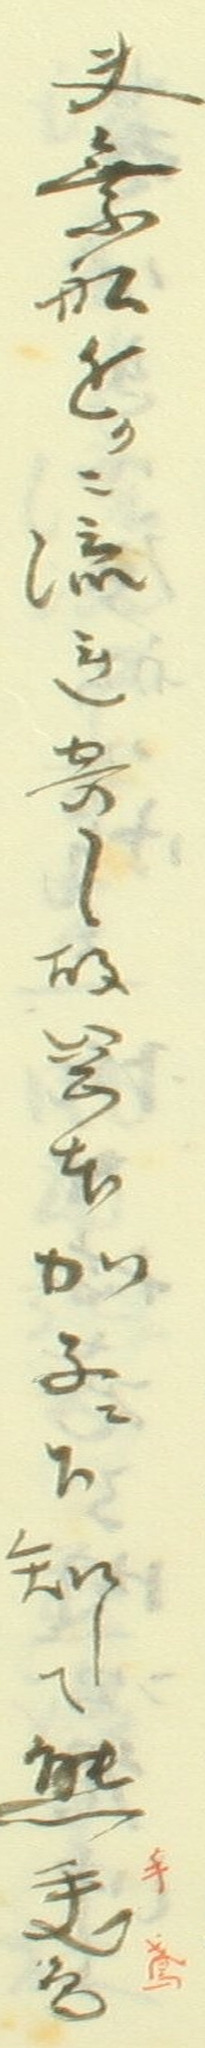夫乗船近くに流れ寄し故岡本加子に下知して熊手鳶
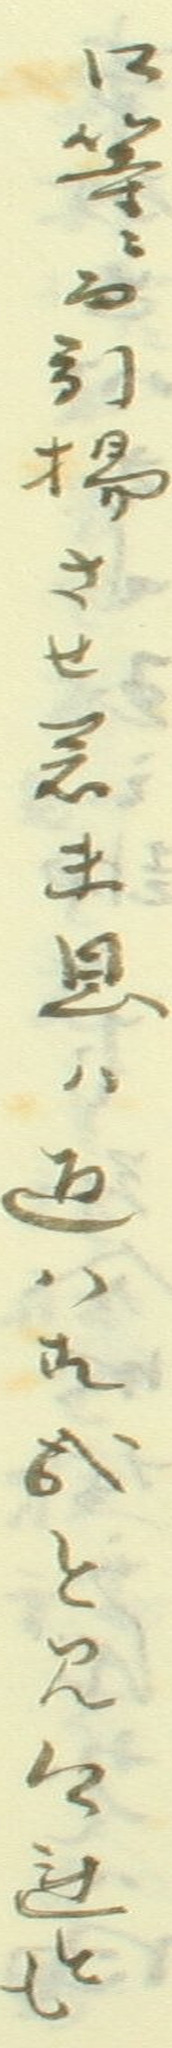口等に而引揚させ若未息は通はす哉と見けれとも
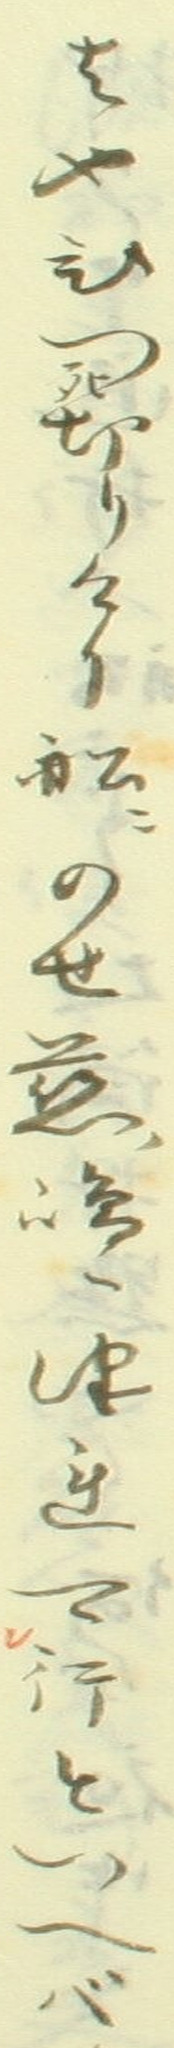はやひつ死切りけり船にのせ慈の嶋へつれ可行といへば
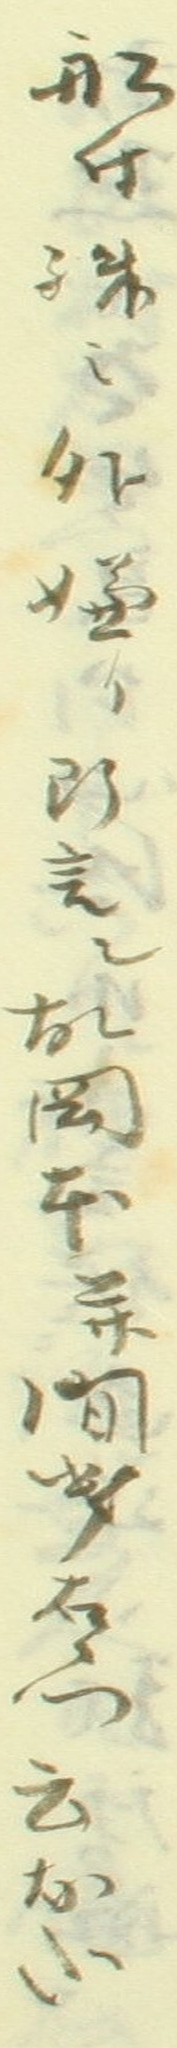船付殊之外嫌り断言し故岡本並間幾右衛門云なだ
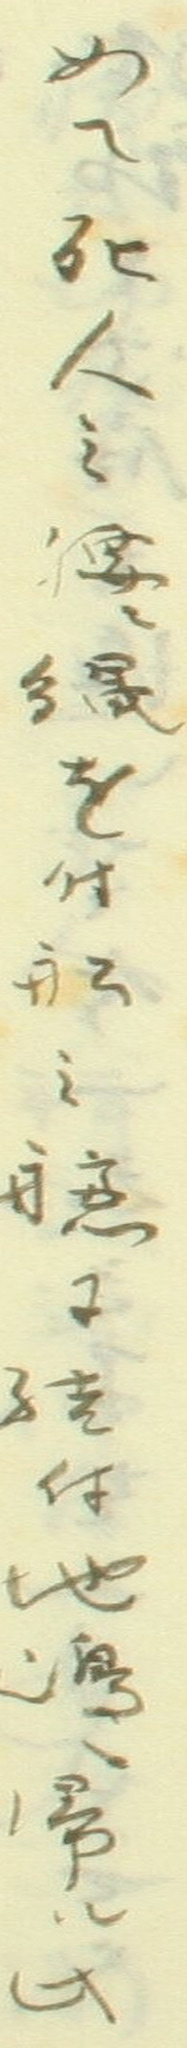めて死人之腰に縄を付船艫に結付地嶋へ帰る此
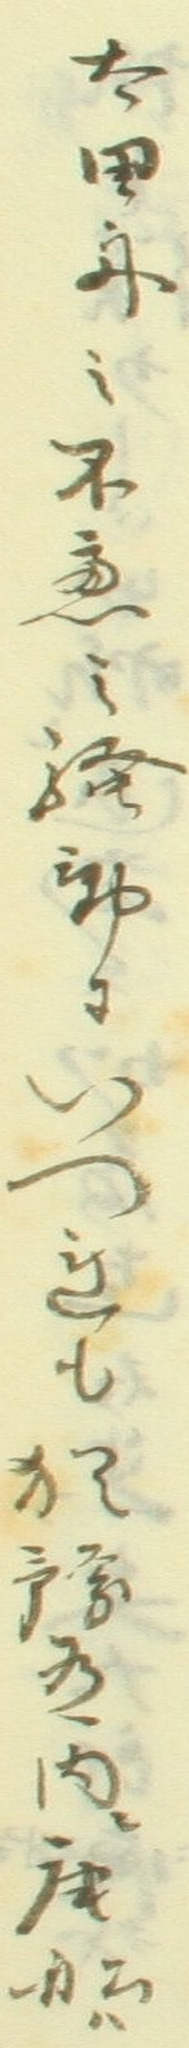太用舟之不兼之験動にいつれも猶？有内に唐船は
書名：唐船漂流記 三
